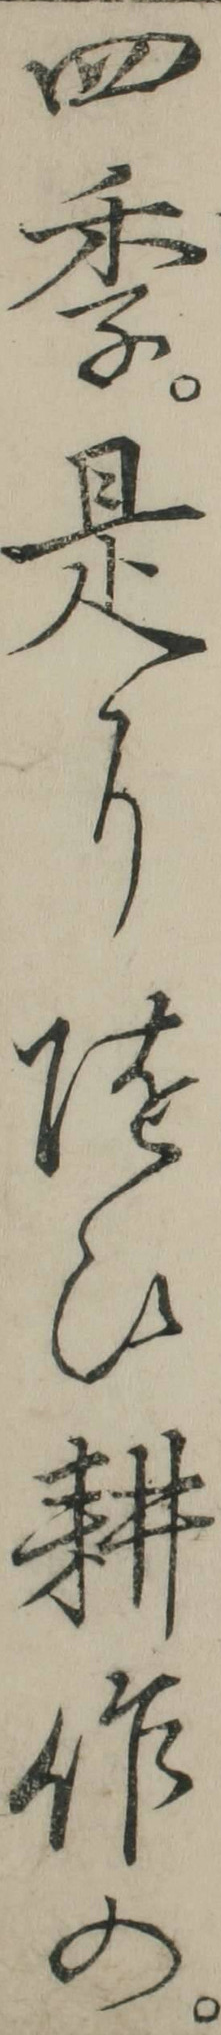四季。是に随ひ耕作の。

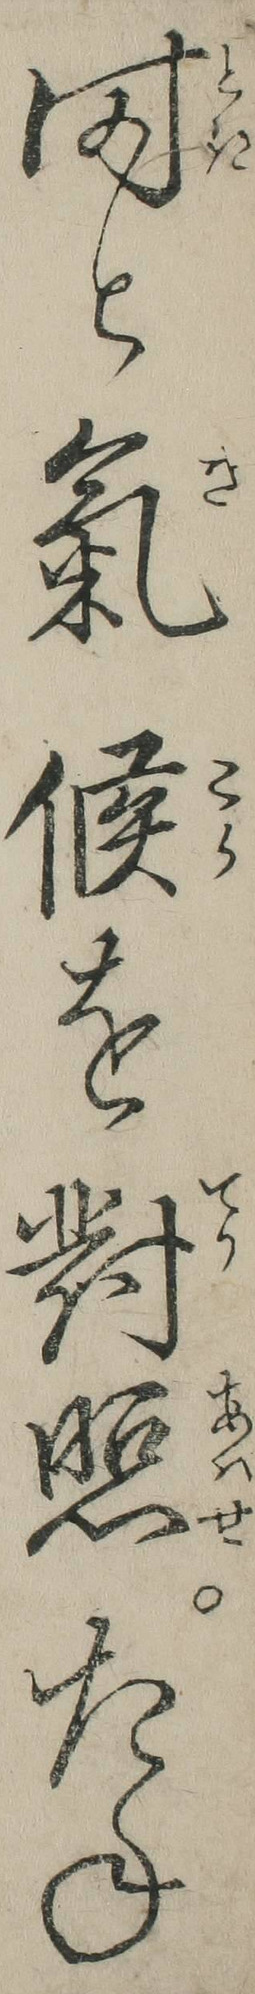時と気候を対照。たね
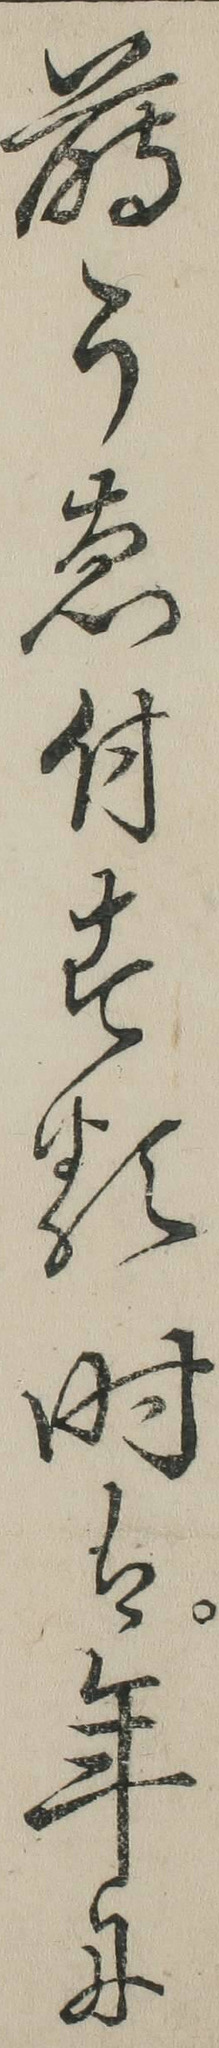蒔うゑ付する時は。年に
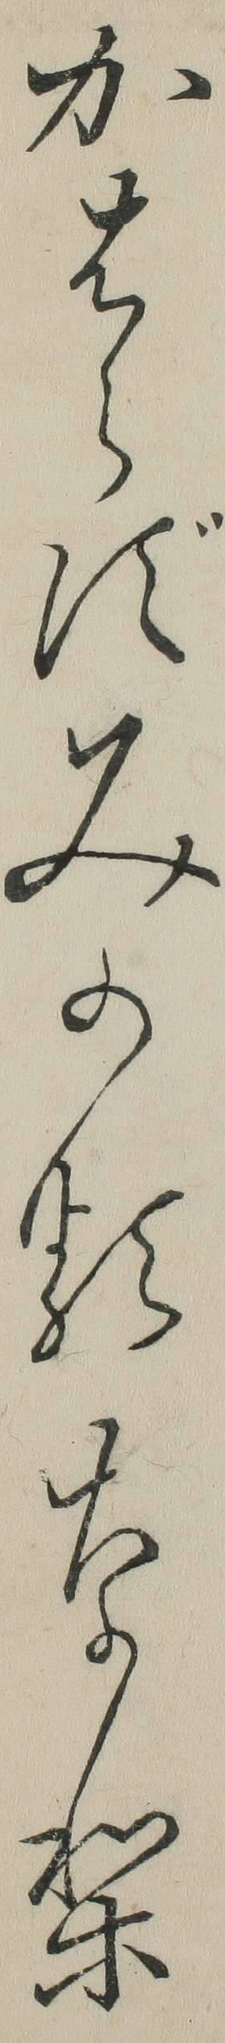かはらずみのるなり
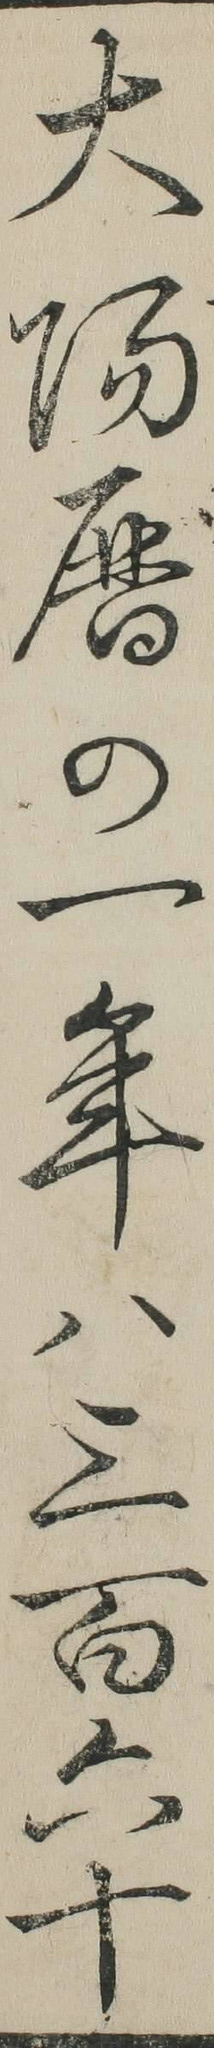太陽暦の一年は三百六十
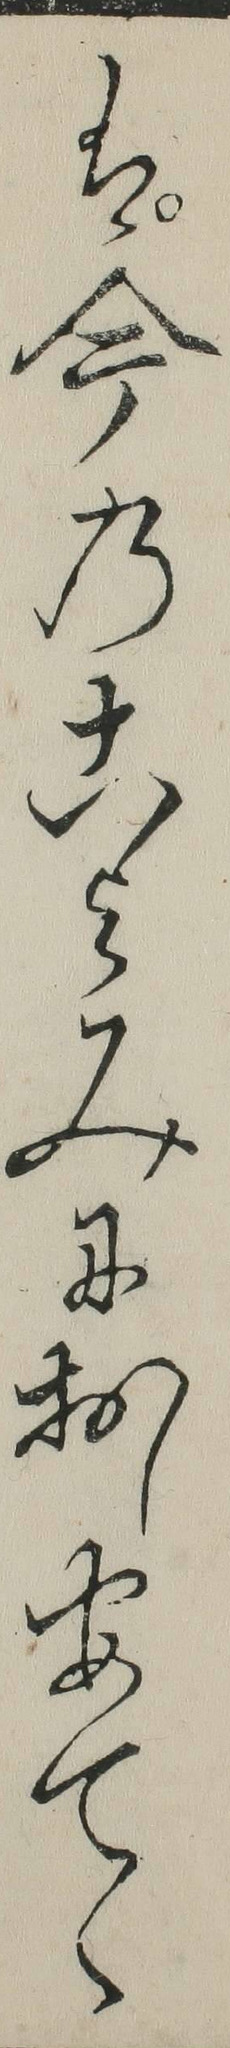は。今のこよみにおしあてゝ
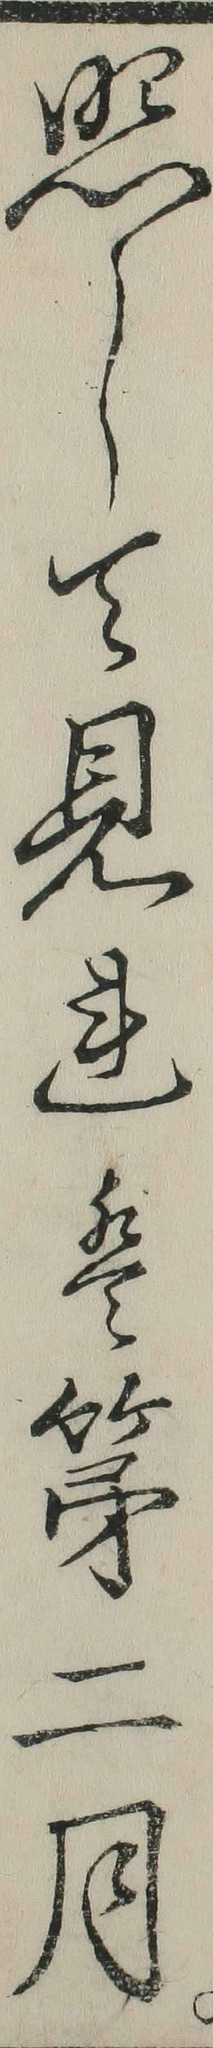照して見れは第二月。
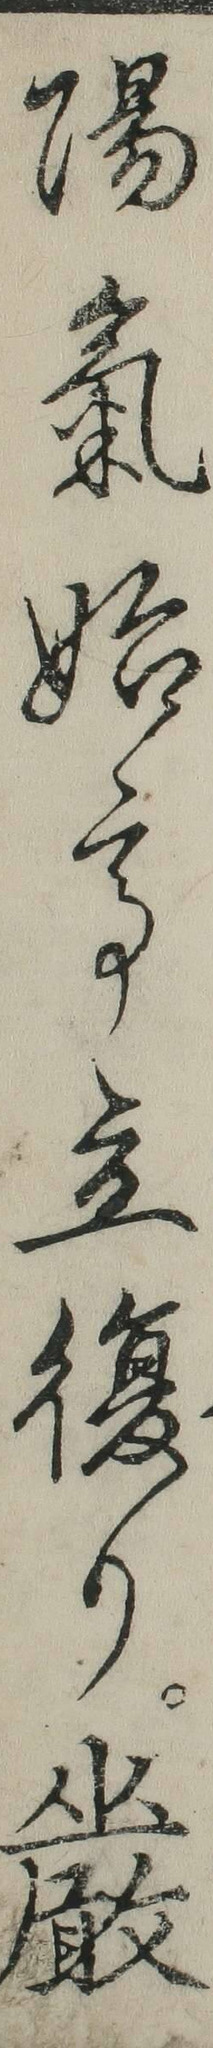陽気始て立復り。厳

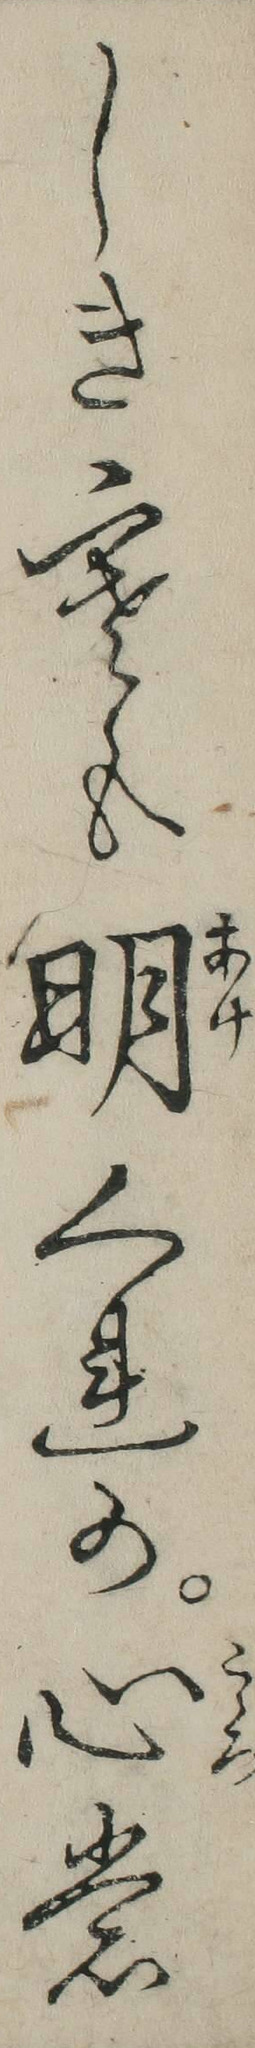しき寒も明くれの。心も
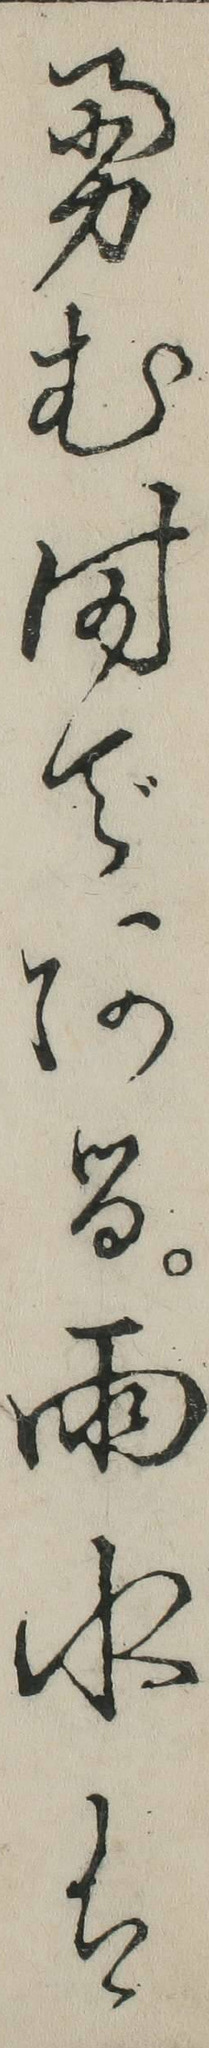勇む時である。雨水は
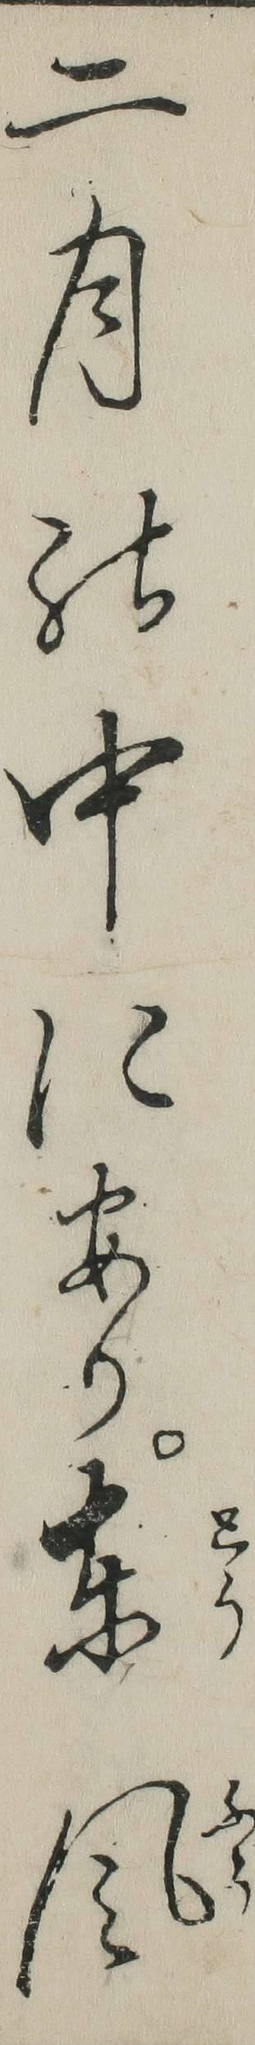二月の中にあり。東風
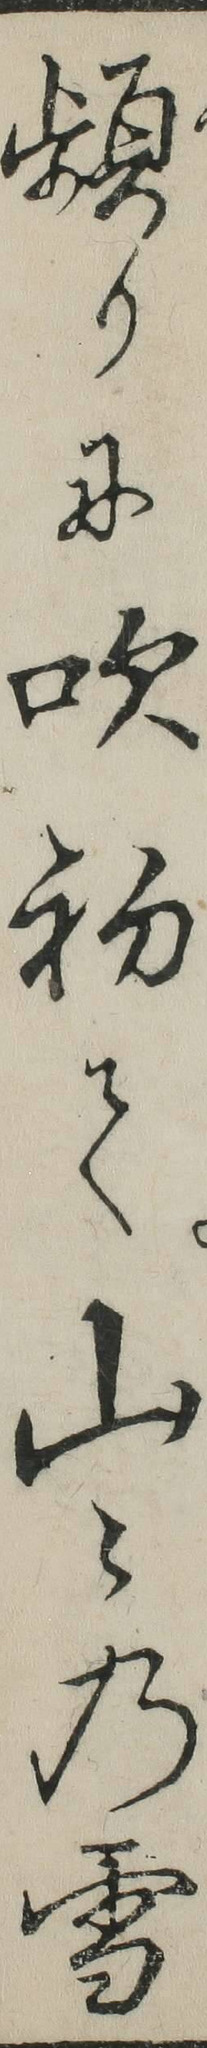頻りに吹初て。山々の雪
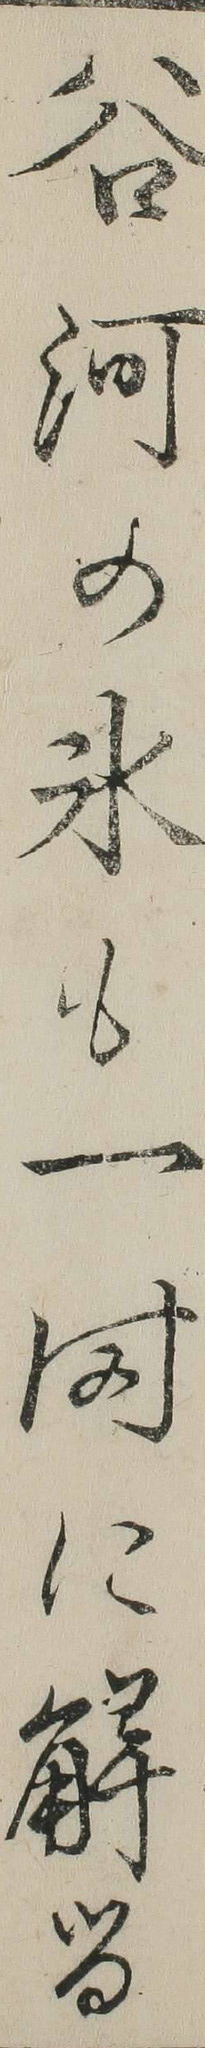谷河の氷も一時に解る
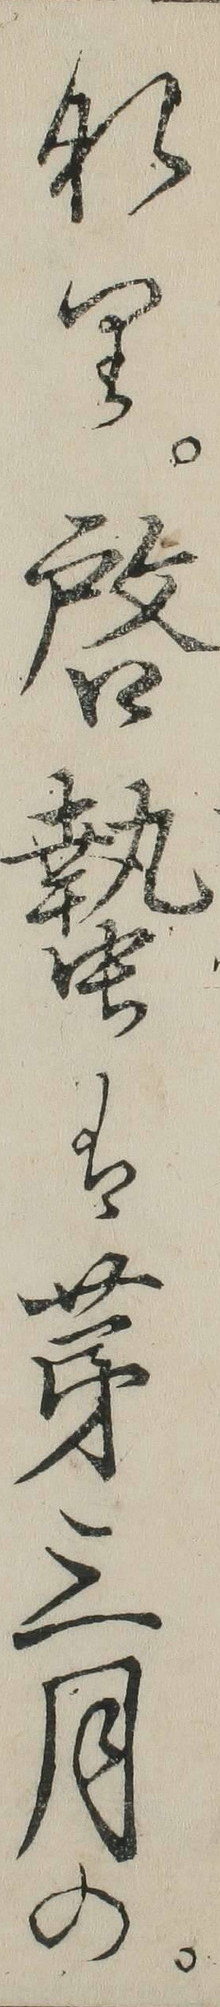なり。啓蟄は第三月の。
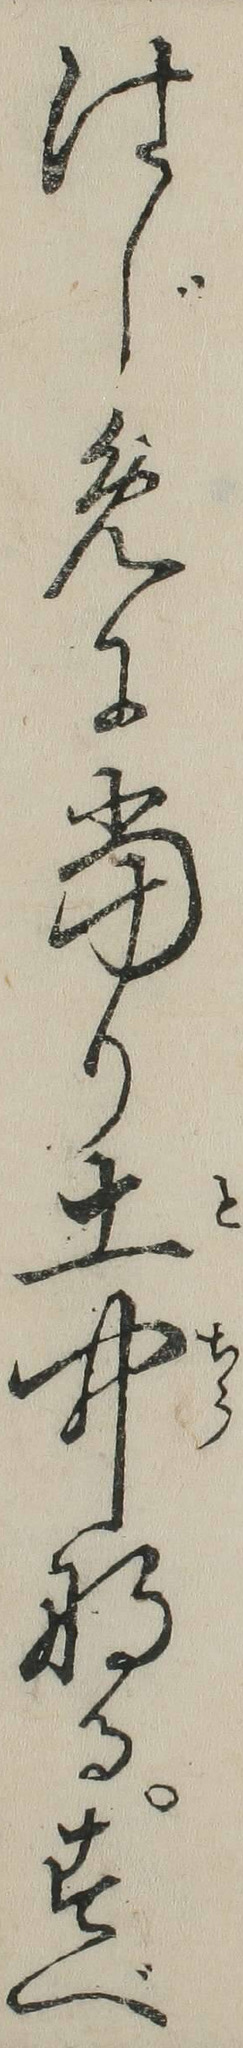はじめに当り土中なる。すべ
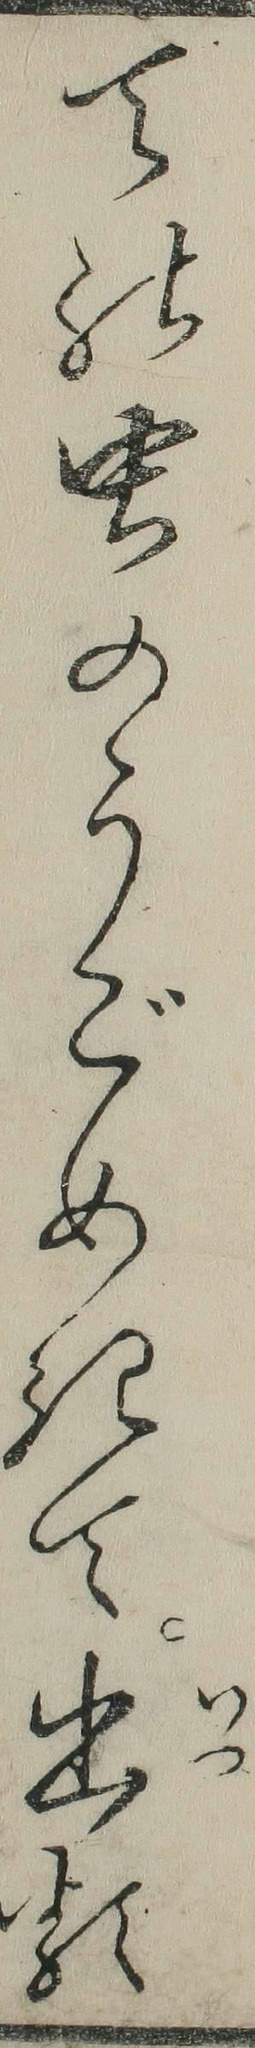ての虫のうごめきて。出る
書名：農蠶必要日読往来
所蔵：東京学芸大学附属図書館 国文学研究資料館
